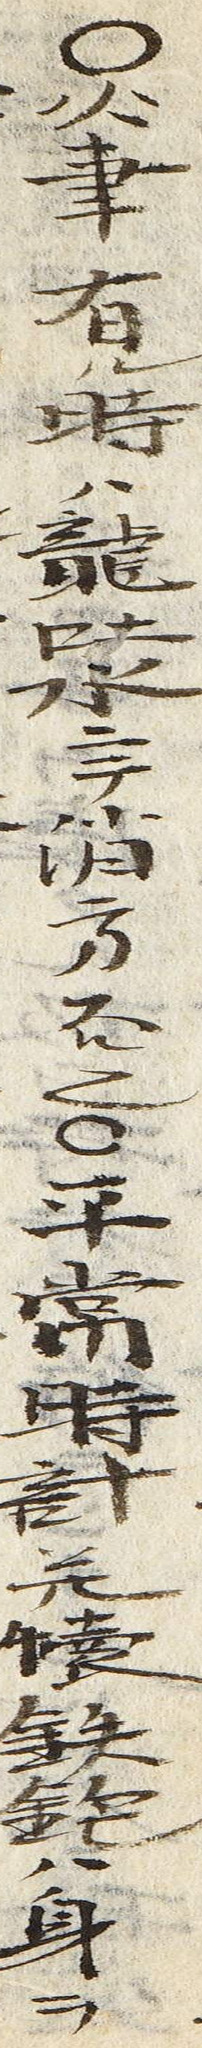〇火事有ル時ハ龍吐水ニテ消方スル也〇平常時計并懐鉄鉋ハ身ヲ
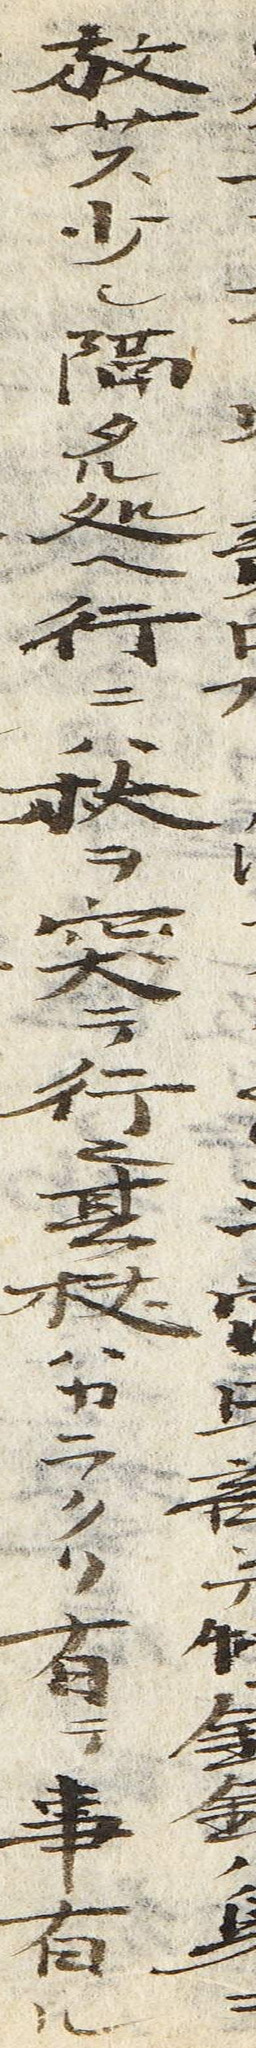放サス少シ隔タル処ヘ行ニハ杖ヲ突テ行也其杖ハカラクリ有テ事有
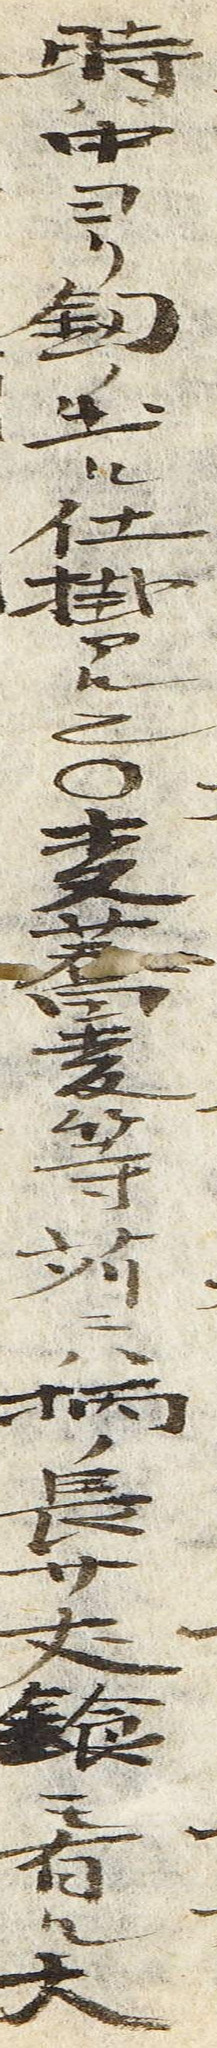時ハ中ヨリ釰ノ出ル仕掛アル也〇麦蕎麦等刈ニハ柄ノ長サ丈モ有
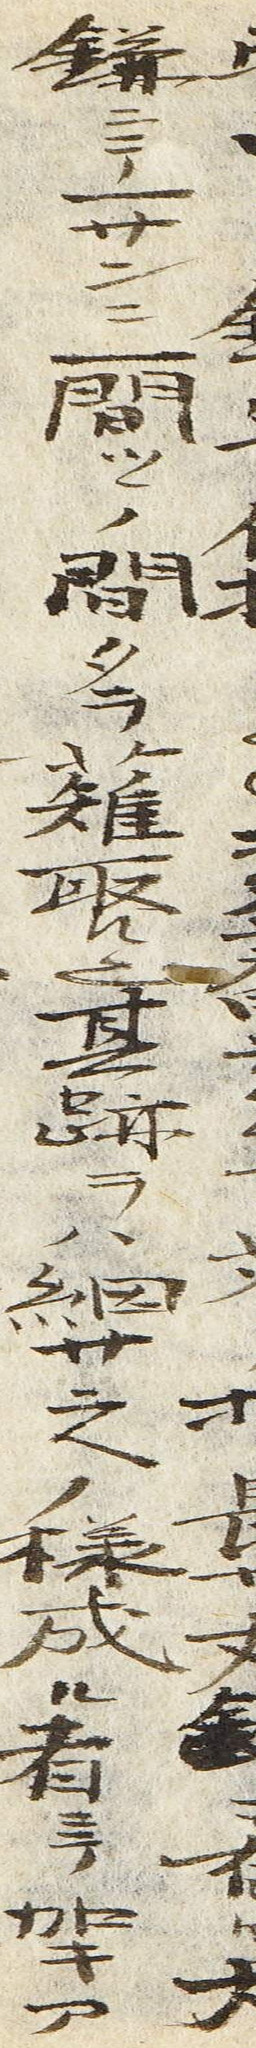鎌ニテ一サンニ一間ツヽノ間タラ薙取ル也其跡ヲハ網サラヘノ様成
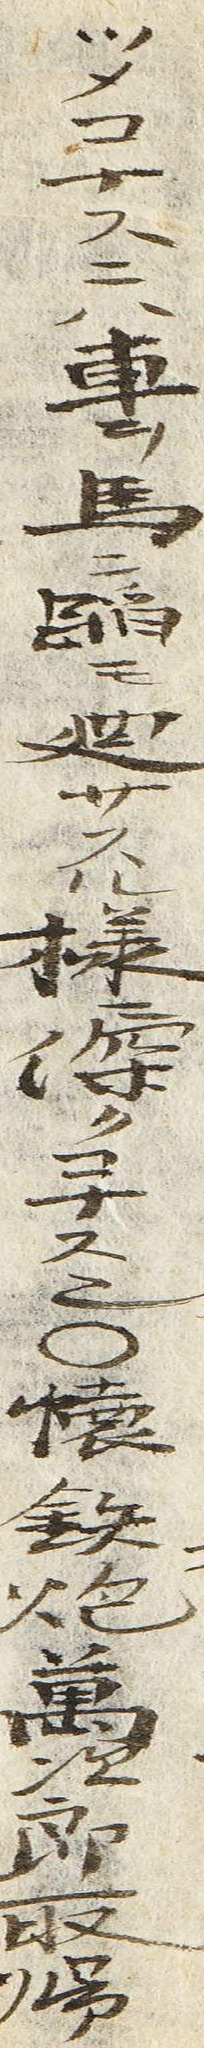ツメコナスニハ車ヲ馬ニ蹈モ廻サスル様深クコナス也〇懐鉄砲萬次郎取帰
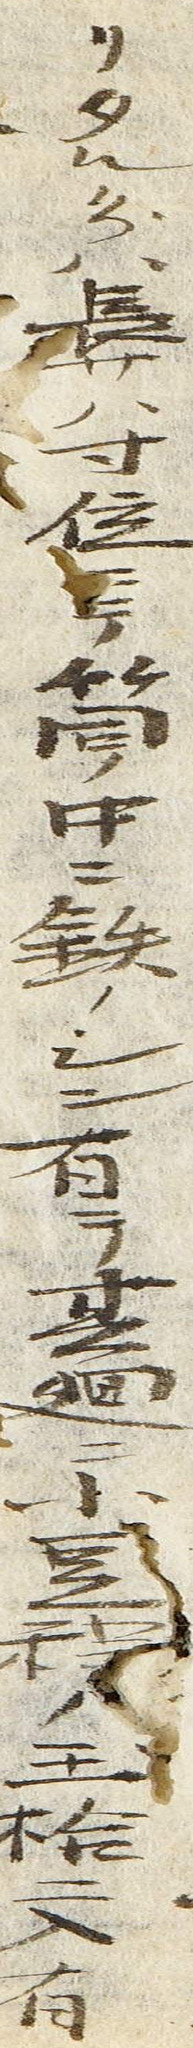リタル分ハ長サ八寸位ニテ筒ノ中ニ鉄ノシン有テ其廻ニ小豆程ノ玉拾二入有
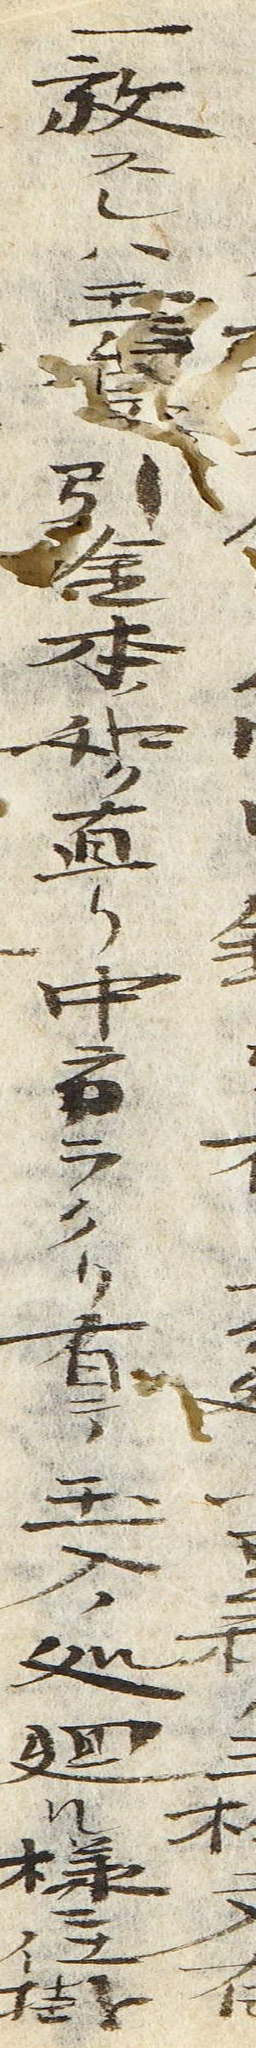一放スレハ玉引金本ノ如ク直リ中ニカラクリ有テ玉入ノ処廻ル様ニ仕掛
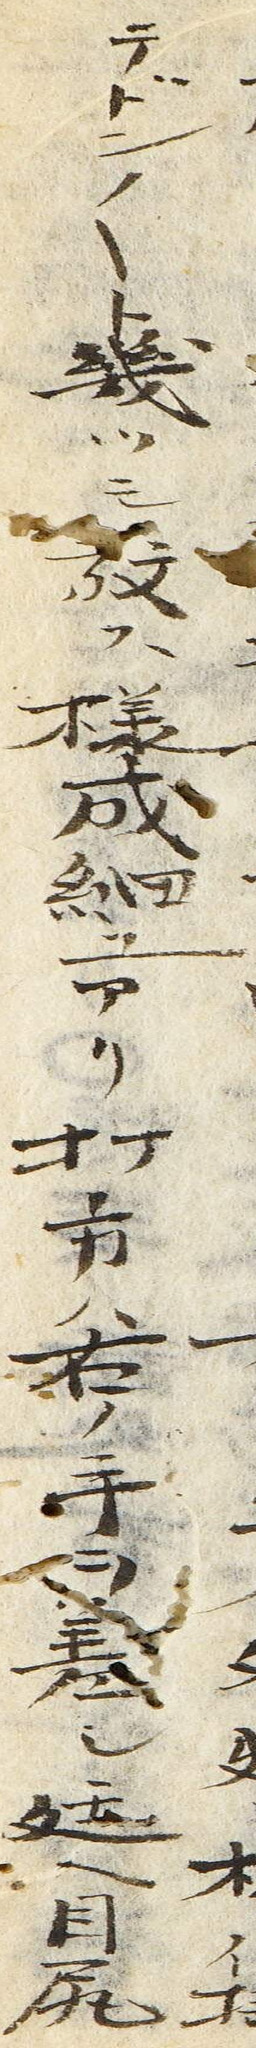テドン〳〵ト幾ツモ放ス様成細工アリ打方ハ右ノ手ヲ差シ廷ヘ目尻

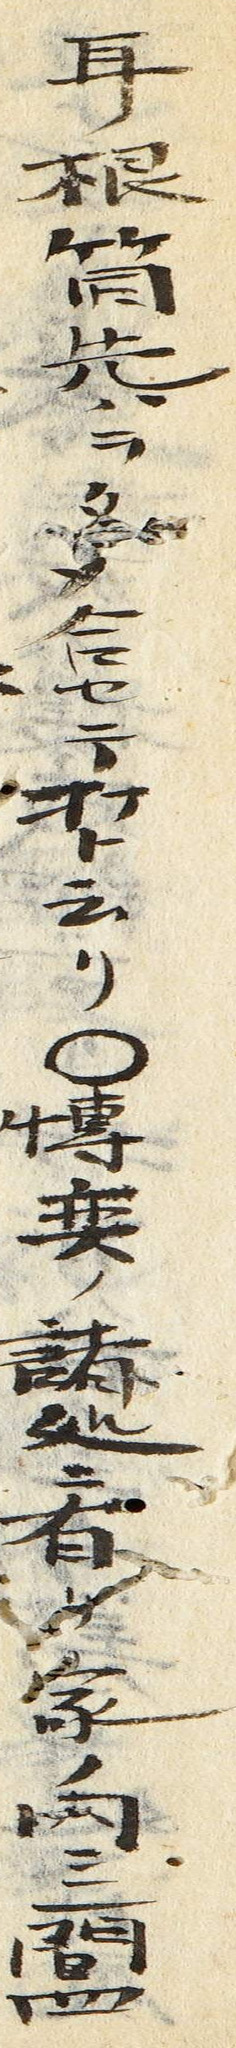耳根筒先ハラタメ合セテ打ト云リ〇博奕ノ諸処ニ有リ家ノ内ニ二
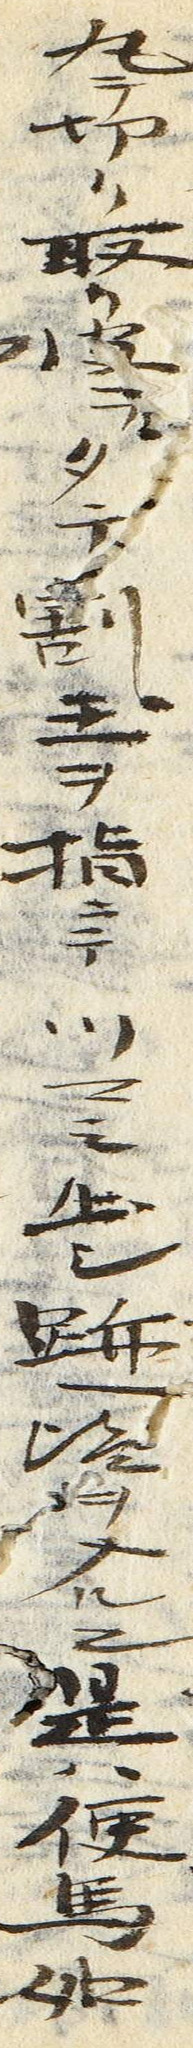丸ヲ切リ取リ皮ヲタテ割玉ヲ指ニテツマミ出シ跡ヘヲ入ル也是ハ使馬如
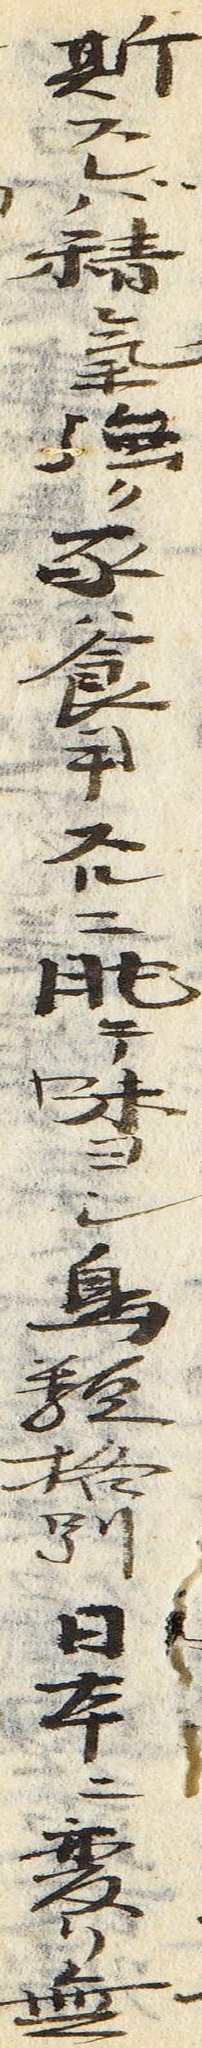斯スレバ精気強ク豚ハ食用スルニ肥テ味ヨシ鳥類格別日本ニ変リ無
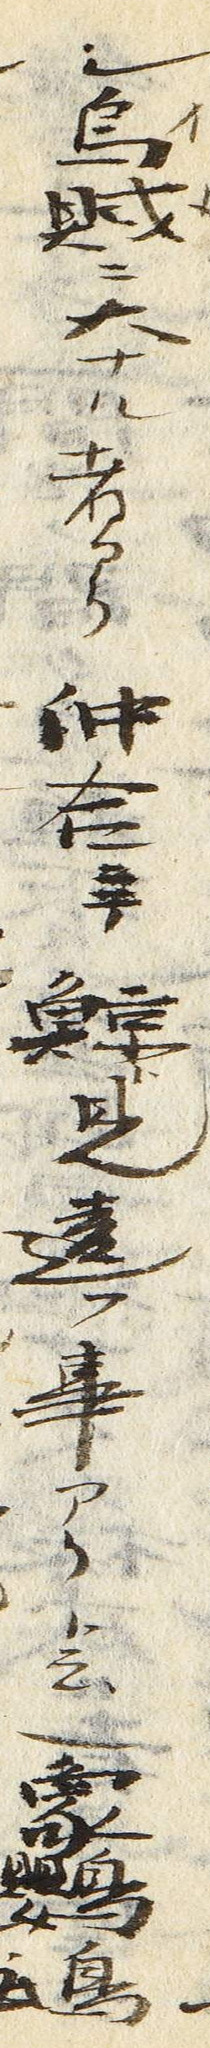シ烏賊ニ大ナル者アリ沖合ニテ鯨ト見違フ事アリト云也象鸚鵡
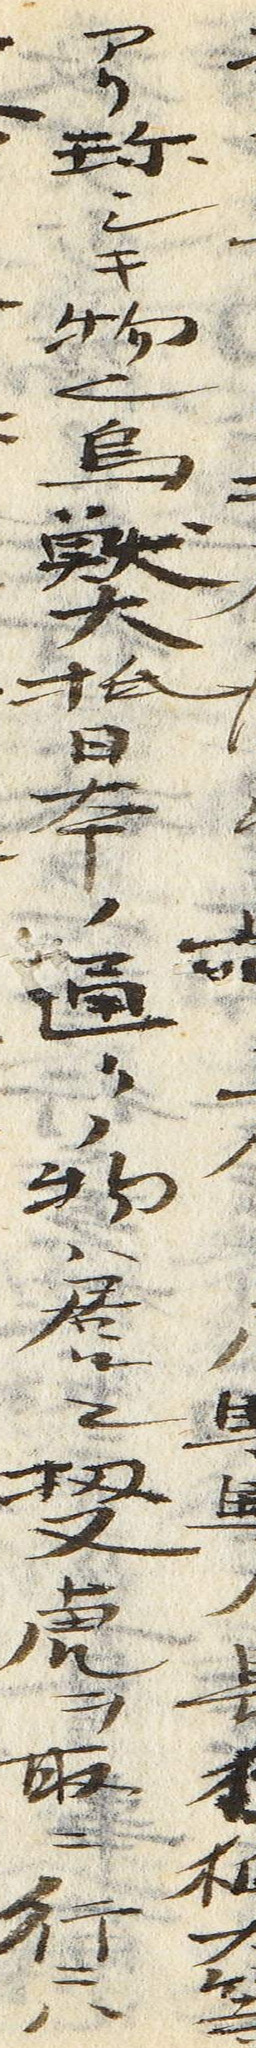アリ珍シキ物也鳥獣大抵日本ノ通リノ物ハ居ル也扨又虎ヲ取ニ行ニハ
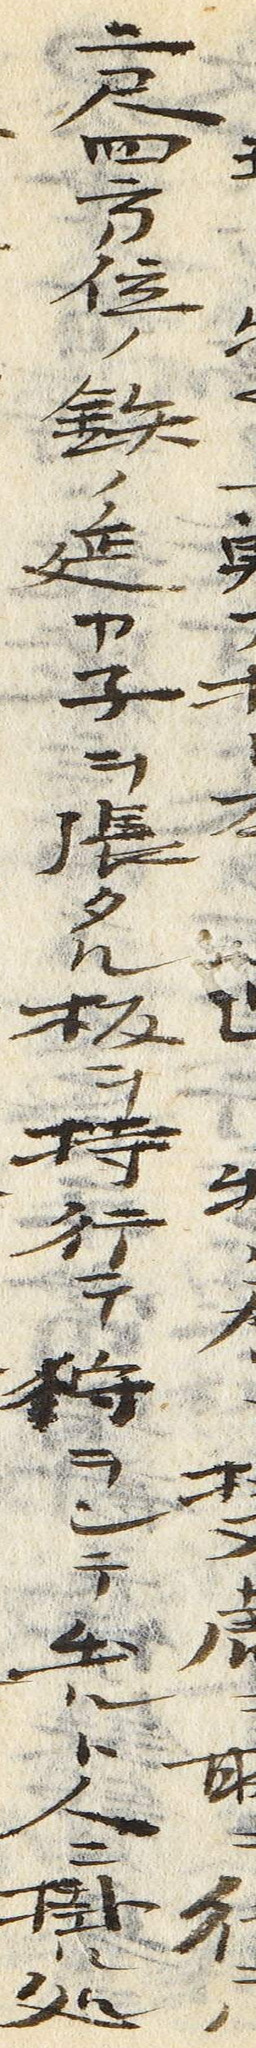二尺四方ノ鉄ノ延カネヲ張タル板ヲ持行テ狩ランテ出ルト人ニ掛ル処
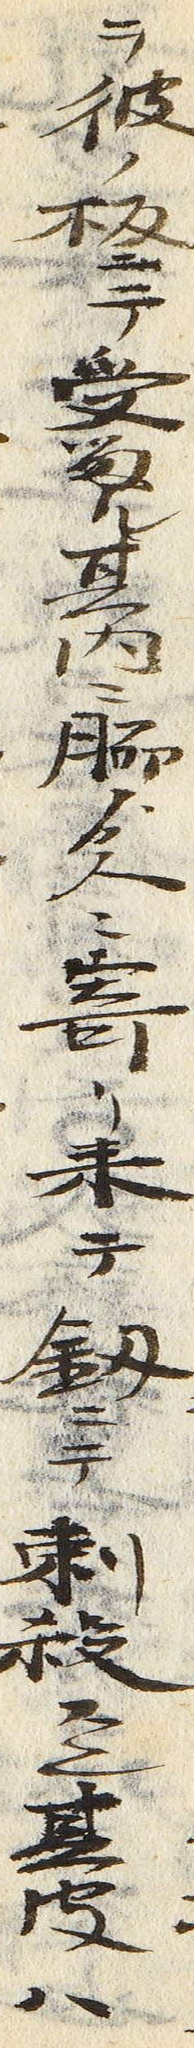ヲ彼ノ板ニテ受留ル其内ニ脇ゟ人々寄リ来テ釼ニテ刺殺ス也其皮ハ
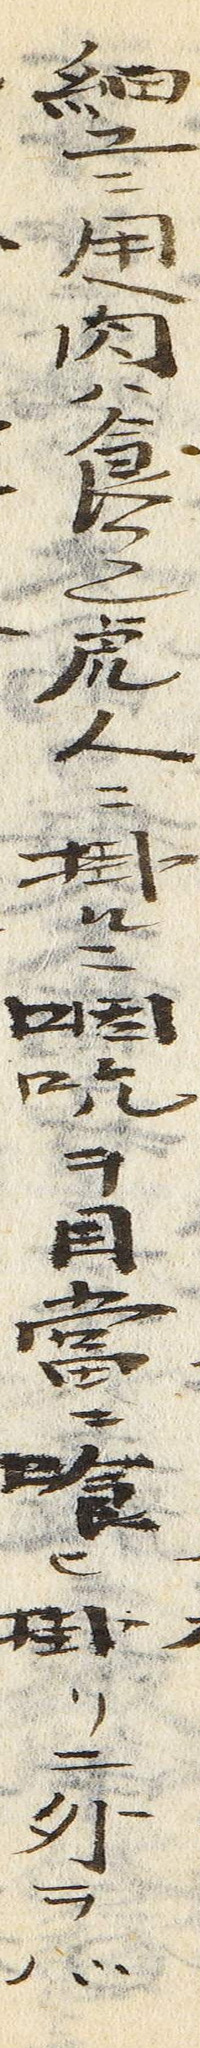細工ニ用へ肉ハ食也虎人ニ掛ルニ咽吭ヲ目当ニ喰ヒ掛リ外ヲバ
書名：漂流記聞
